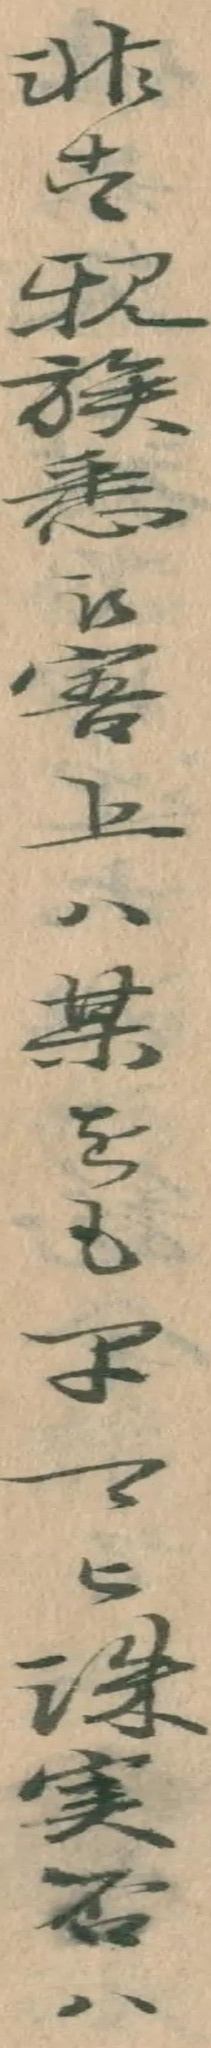非春親族悉被害上は某をも早可被誅実否は
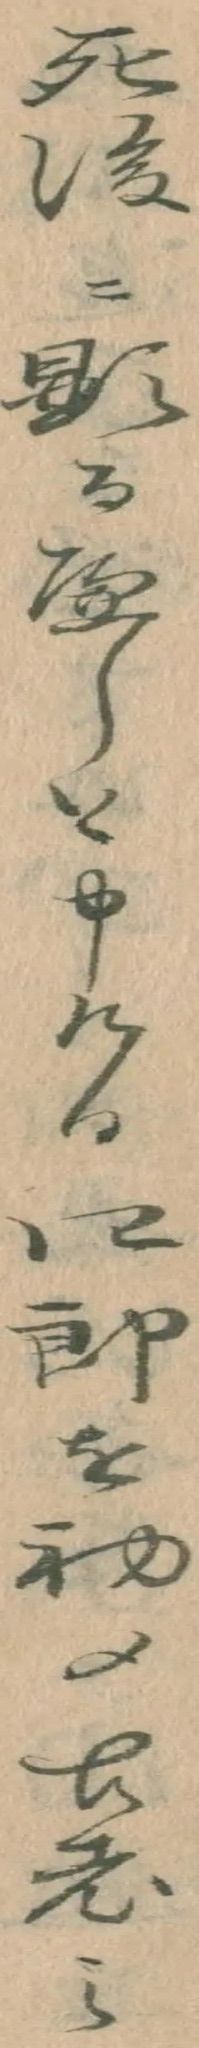死後に顕る扁しと申ける四郎を初め古老之
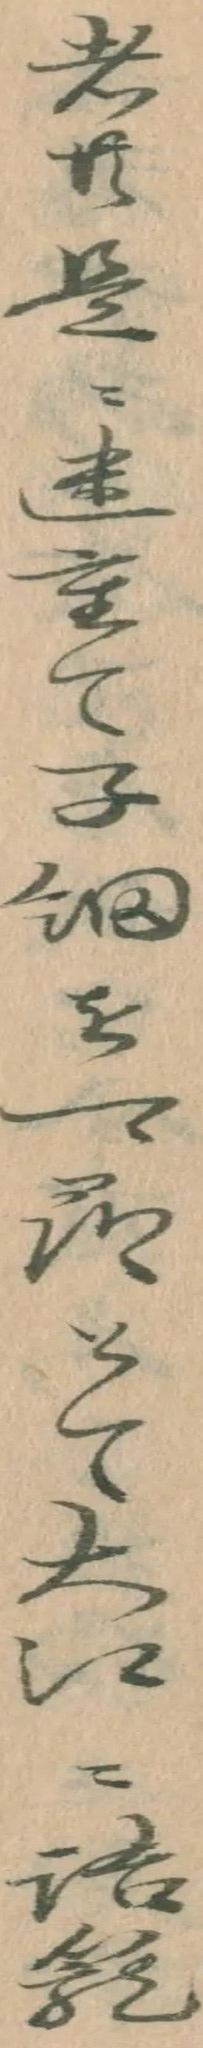者共是に迷重て子細を可尋とて大江に詰籠
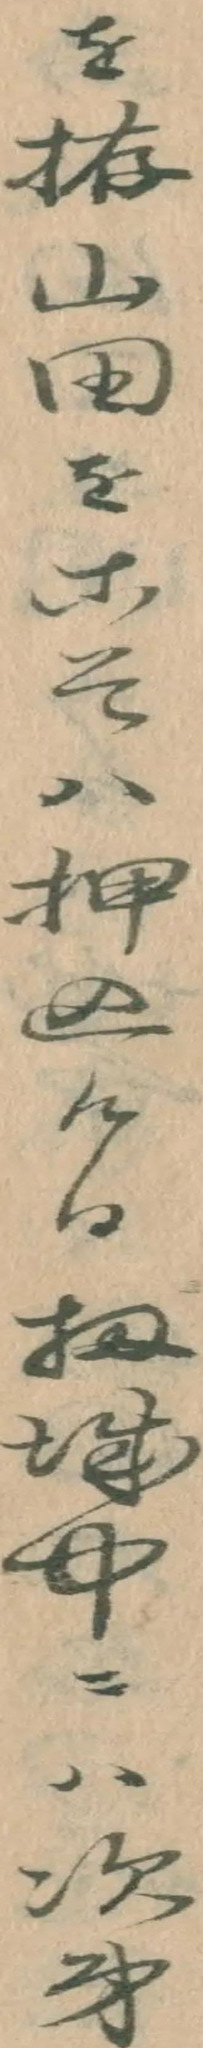を拵山田を古そは押込ける扨城中には次第
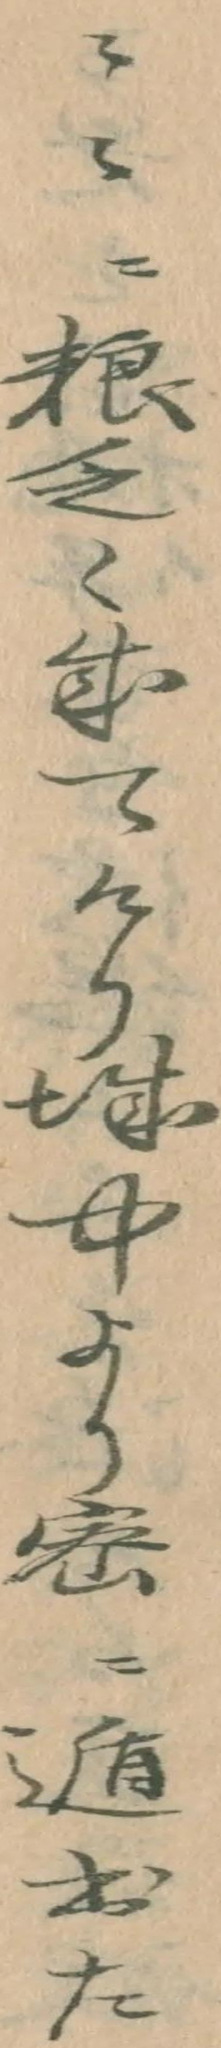々々に粮乏く成てけり城中より密に遁出た

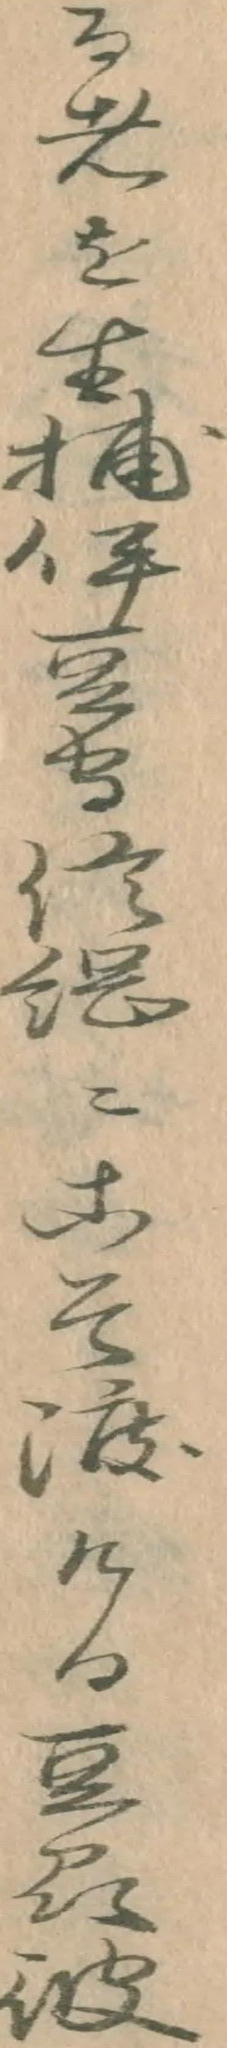る者を生捕伊豆守信綱に古そ渡ける豆州彼
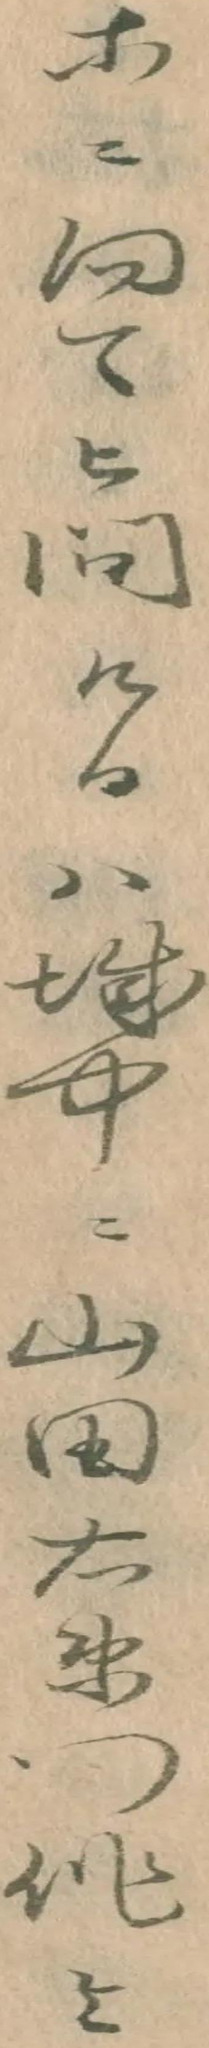等に向て被問けるは城中に山田右衛門作与
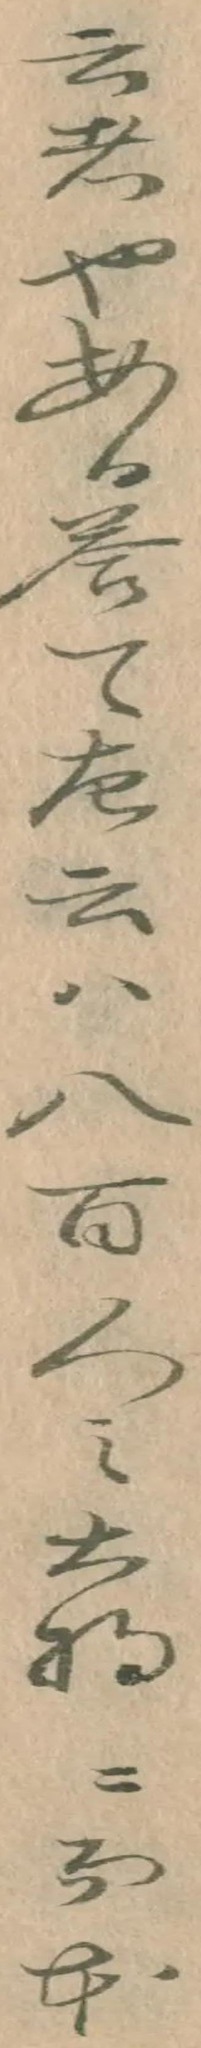云者やある答て左云は八百人之大将に而本
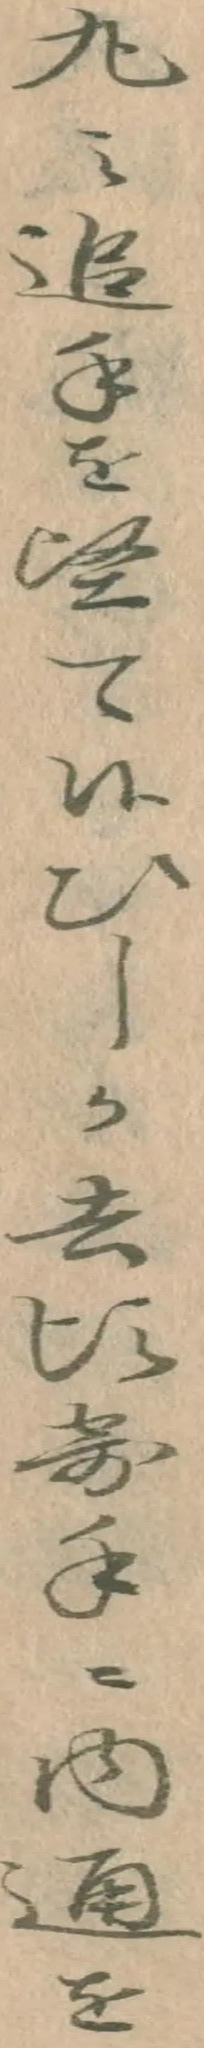丸之追手を堅て候ひしか去頃寄手に内通を
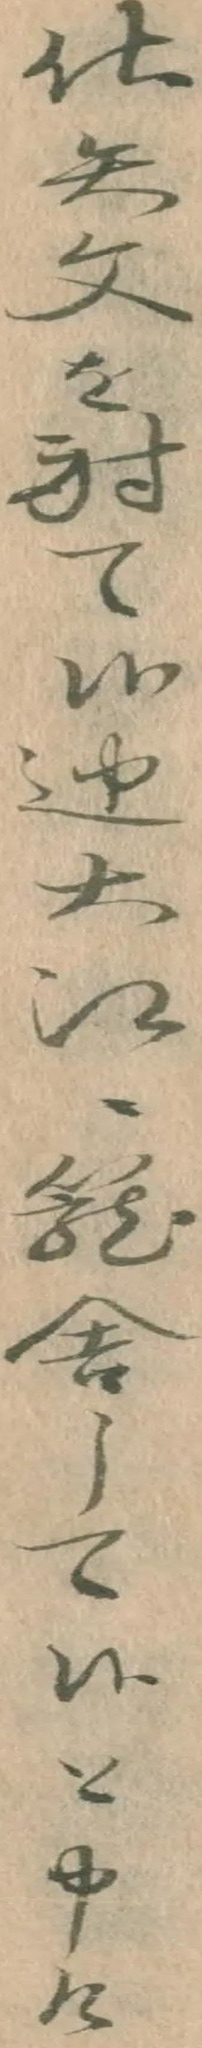仕矢文を射て候迚大江に籠舎して候と申け
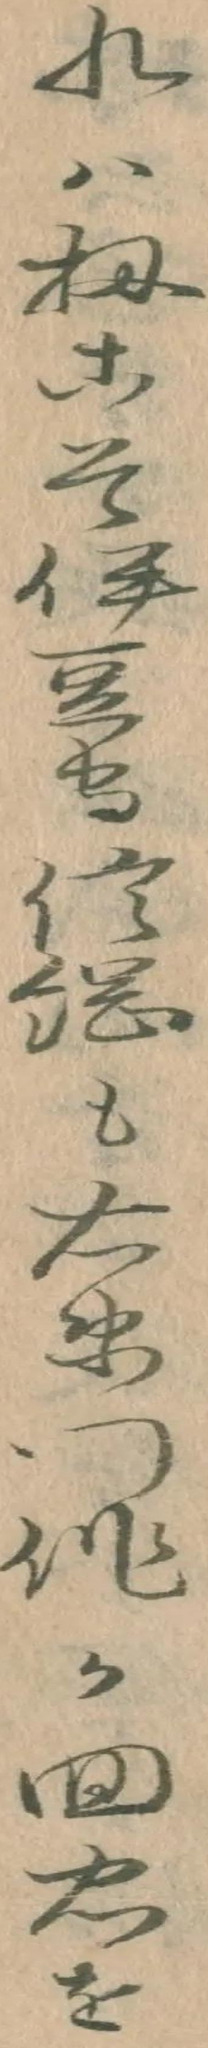れは扨古そ伊豆守信綱も右衛門作か回忠を
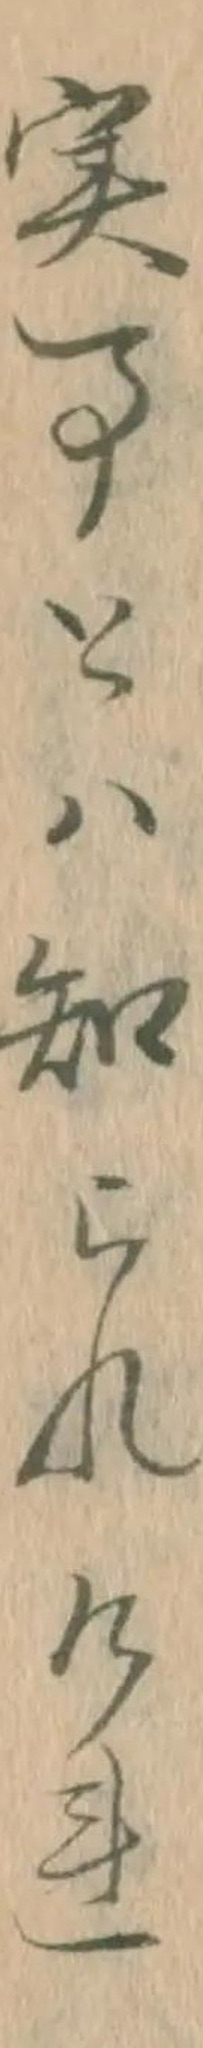実事とは知られけ連
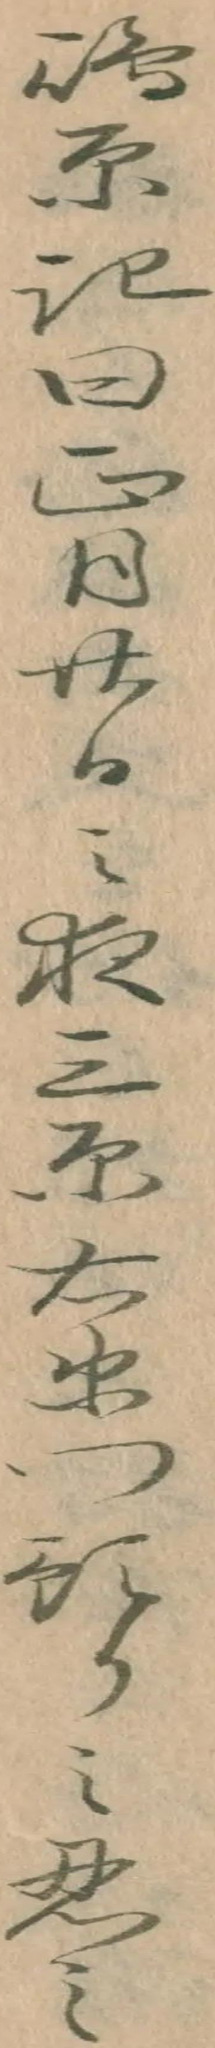島原記曰正月廿日之夜三原右衛門預り之忍之
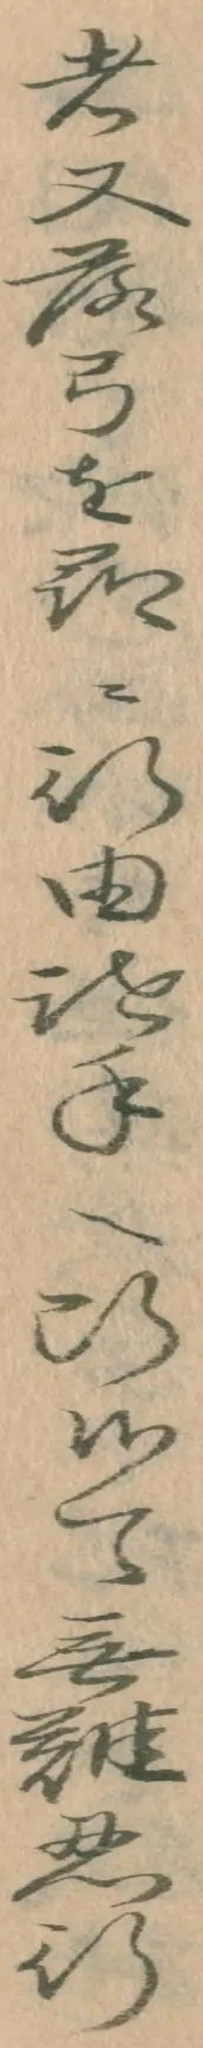者又落弓を尋に行由諸手へ断候て無難忍行
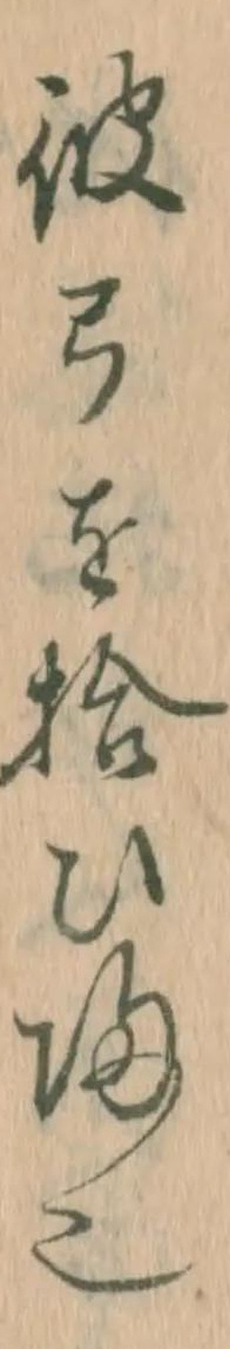彼弓を拾ひ帰也
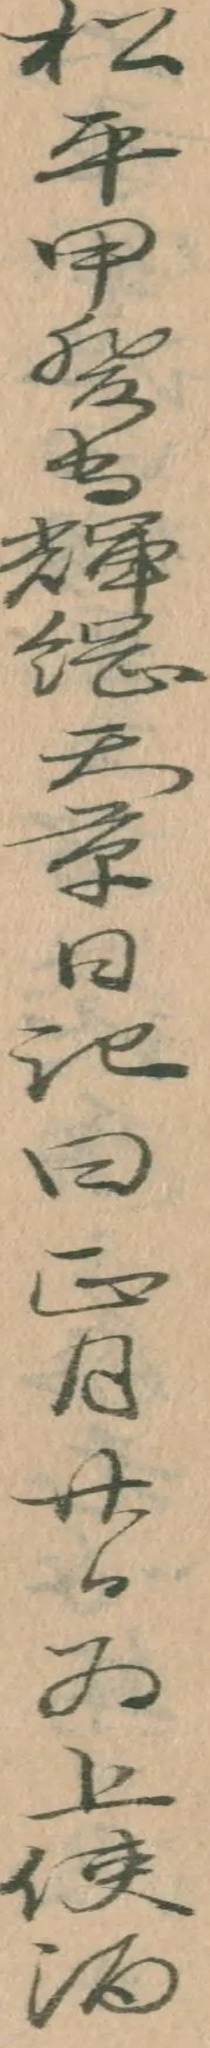松平甲斐守輝綱天草日記曰正月廿日ゐ上使酒
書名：切支丹御退治記 49巻. [6]
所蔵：国立国会図書館 National Diet Library, JAPAN
